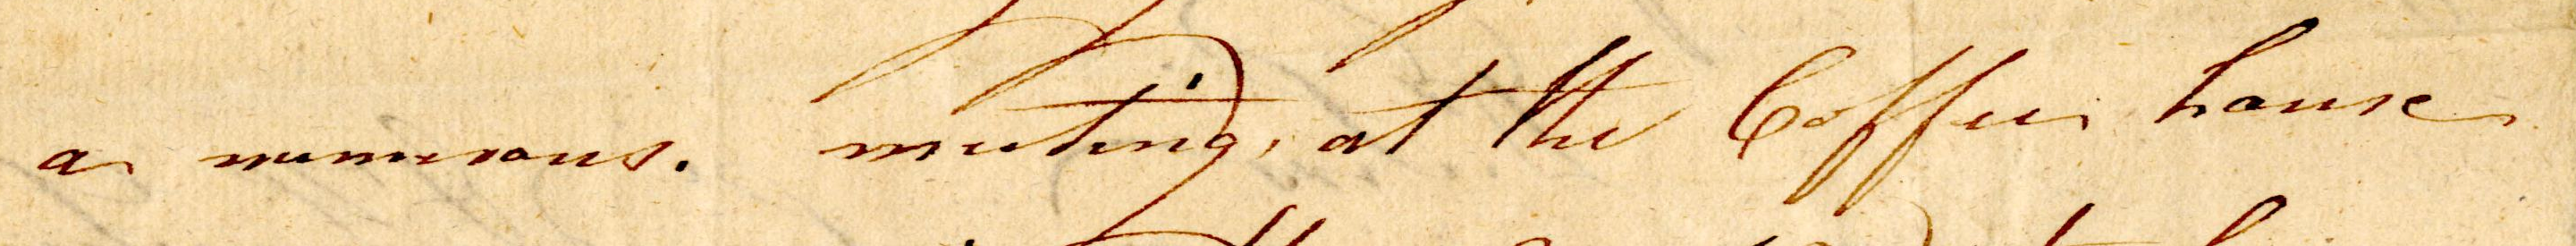a numerous meeting at the Coffee house
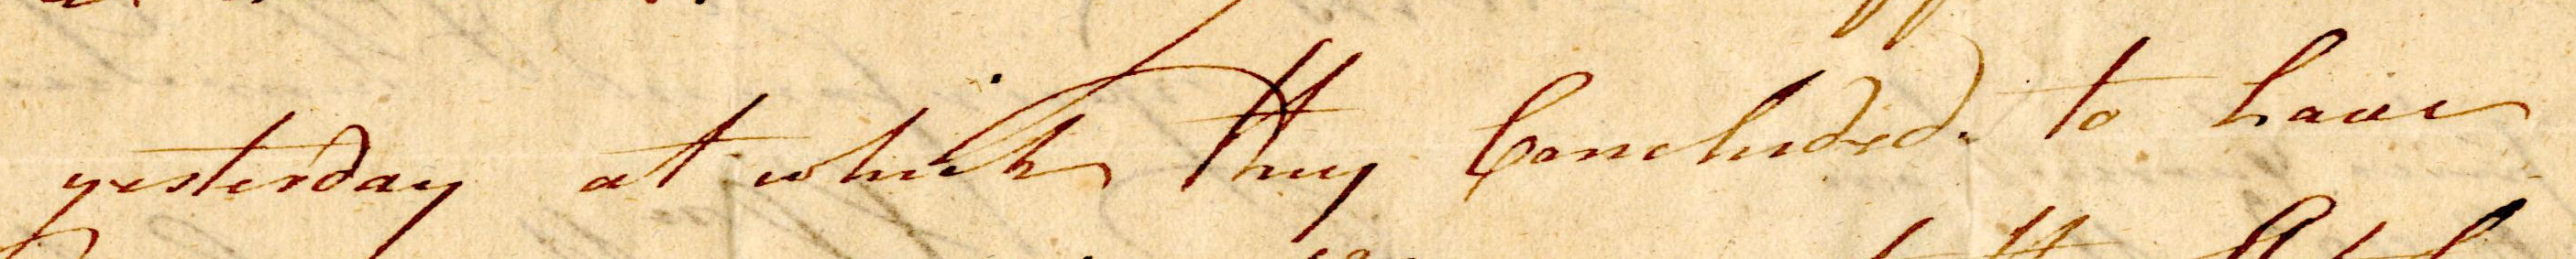yesterday at which they concluded to have
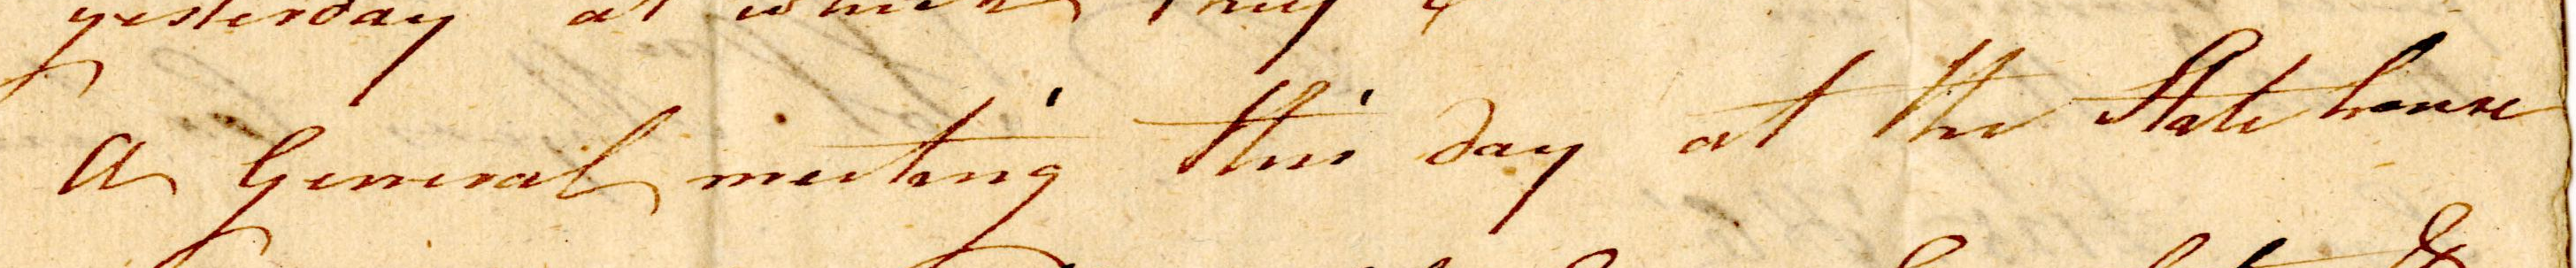a General meeting this day at the State house
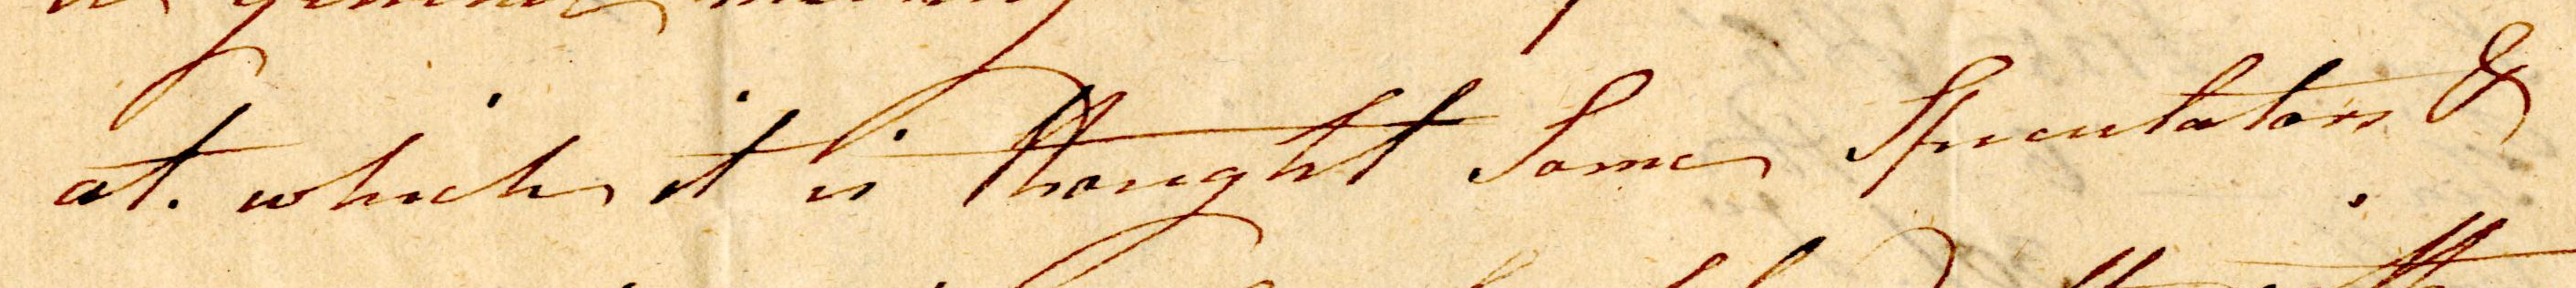at which it is Thought Same Speculators &
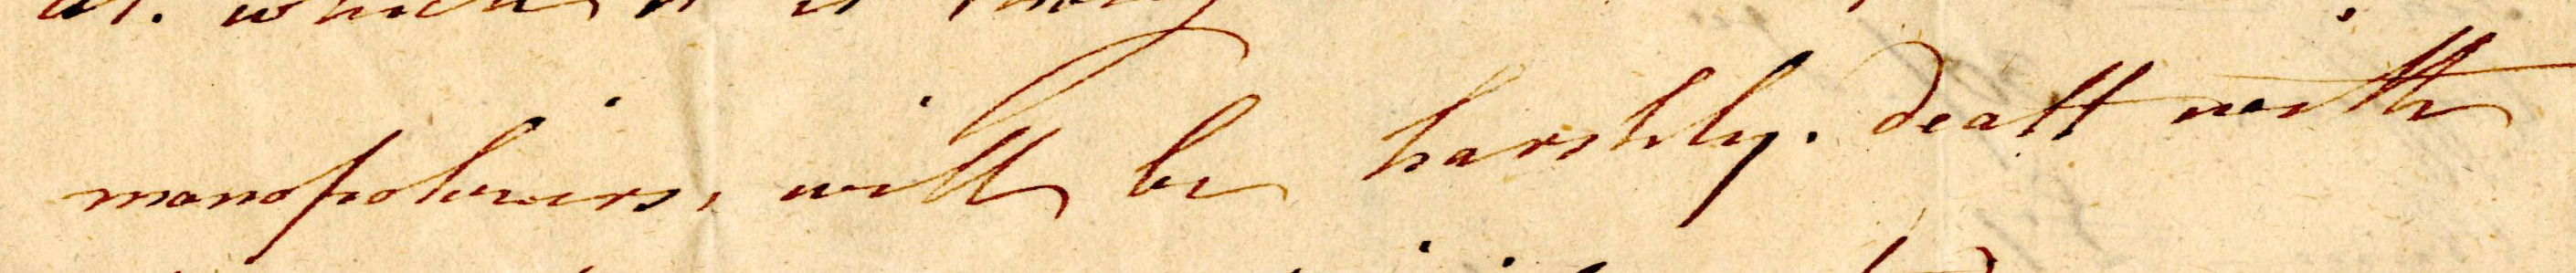manopoliouers, will be harshly. dealt with
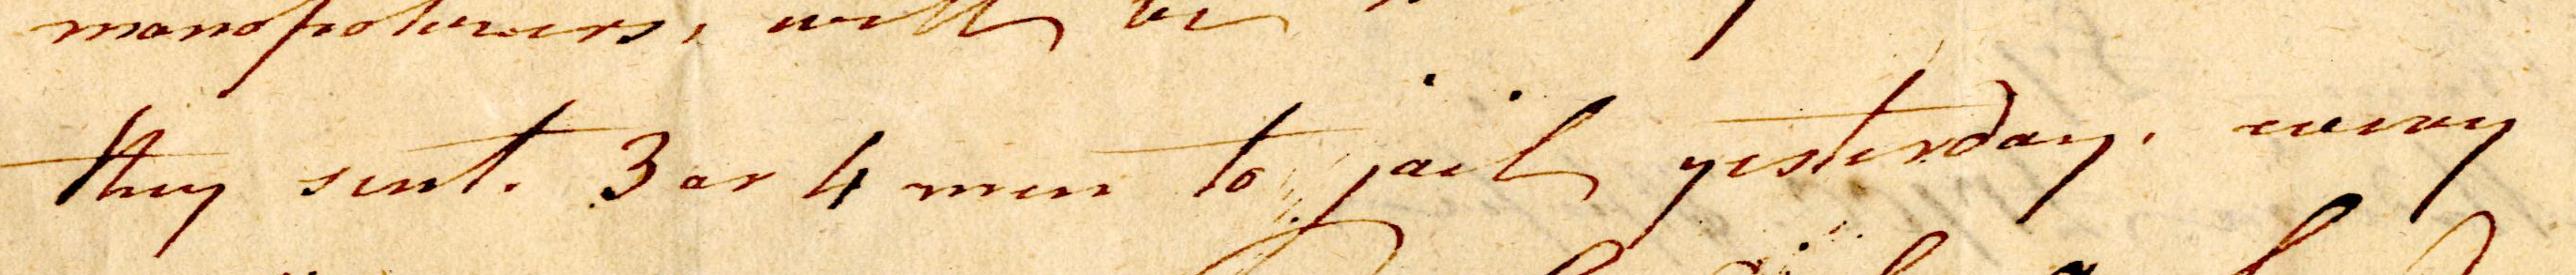they sent 3 or 4 men to jail yesterday. every
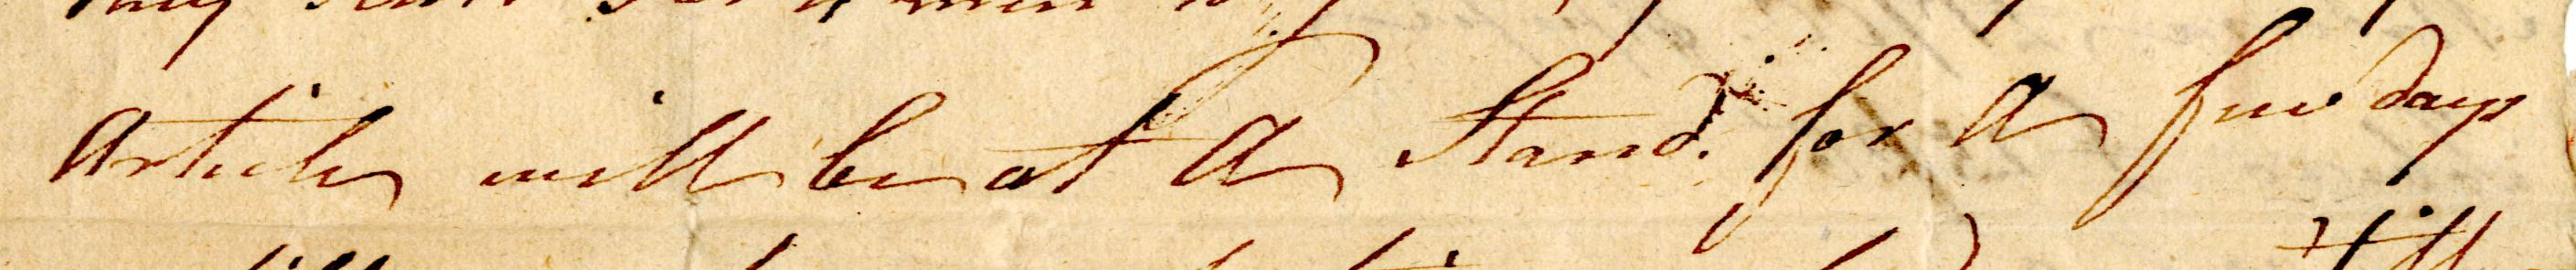Article will be at A Stand for A few days
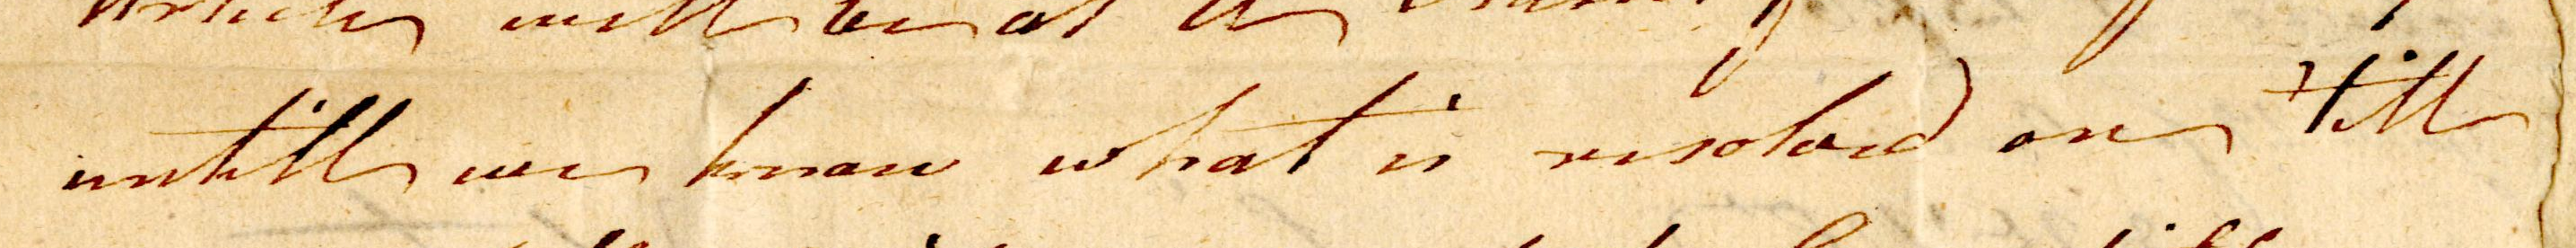untill we know what is resolved on 'till
